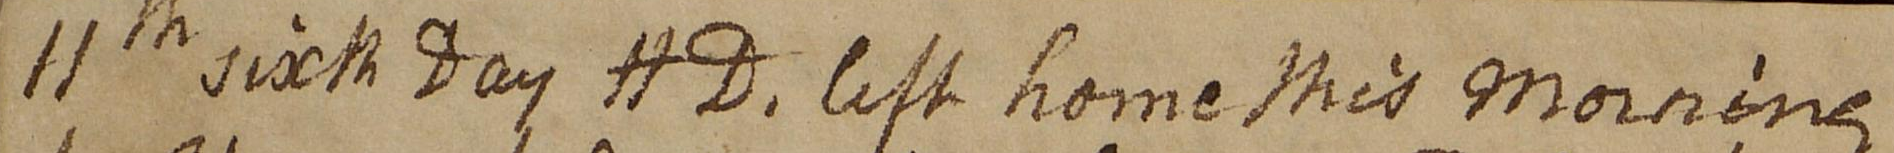11^th sixth Day HD, left home this morning
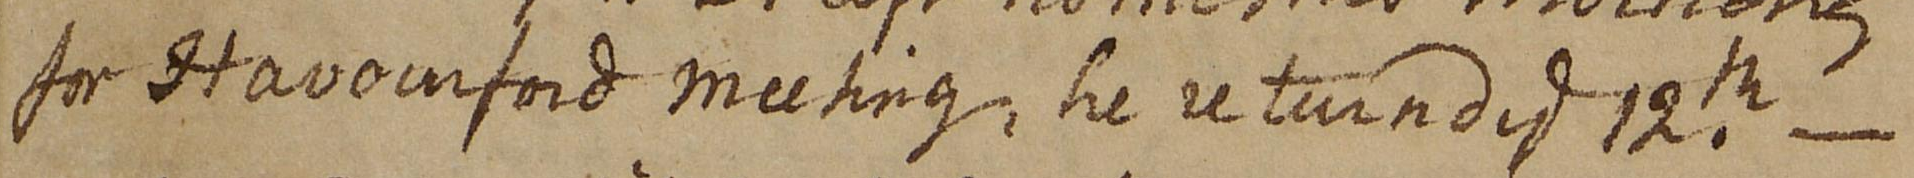for Havourford meeting, he returnd y^e 12^th.-
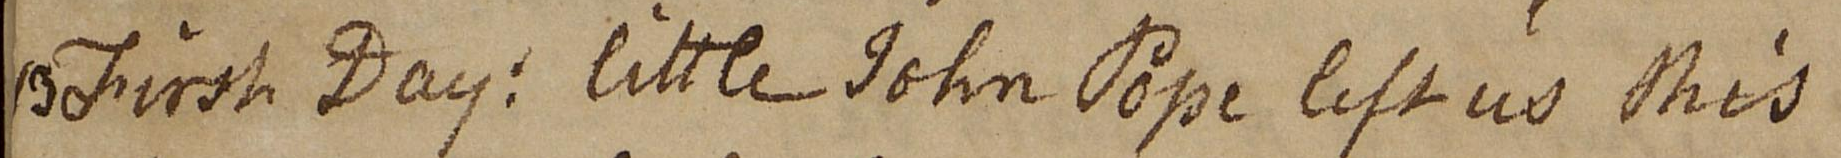13 First Day: little John Pope left us this
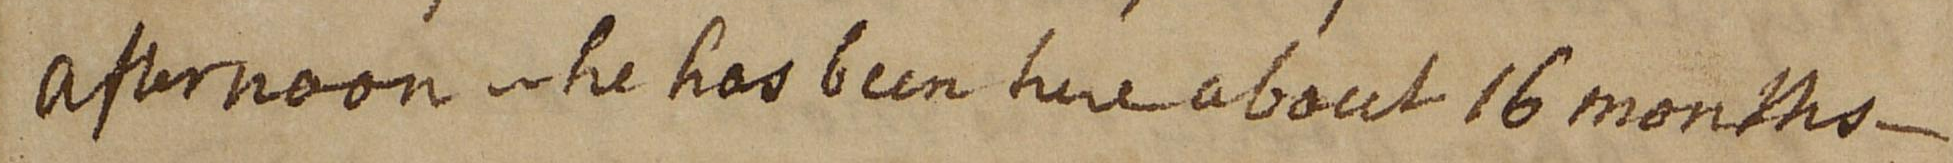afternoon- he has been here about 16 months-
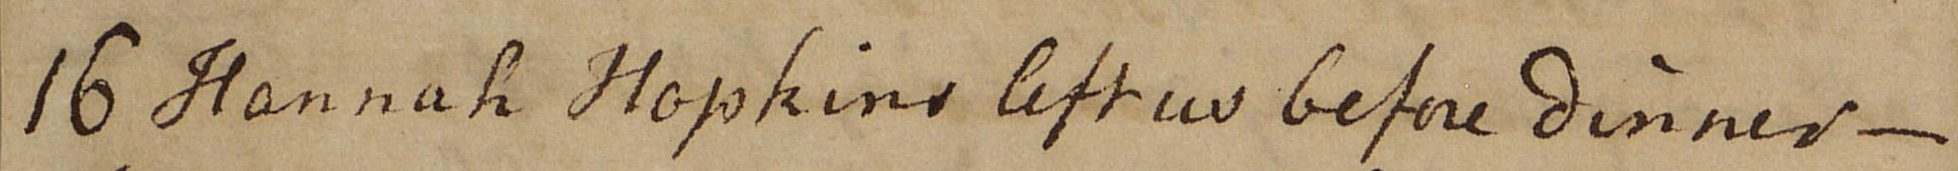16 Hannah Hopkins left us before dinner-
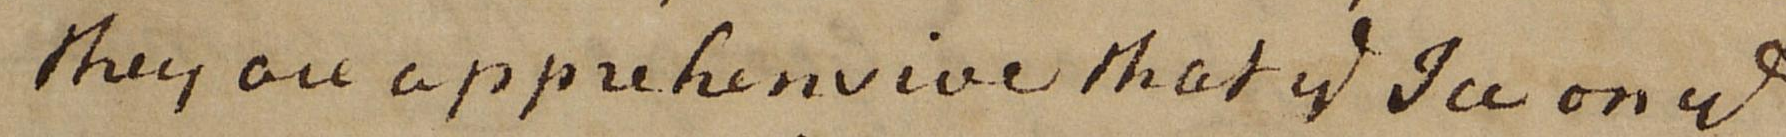they are apprehensive that y^e Ice on y^e
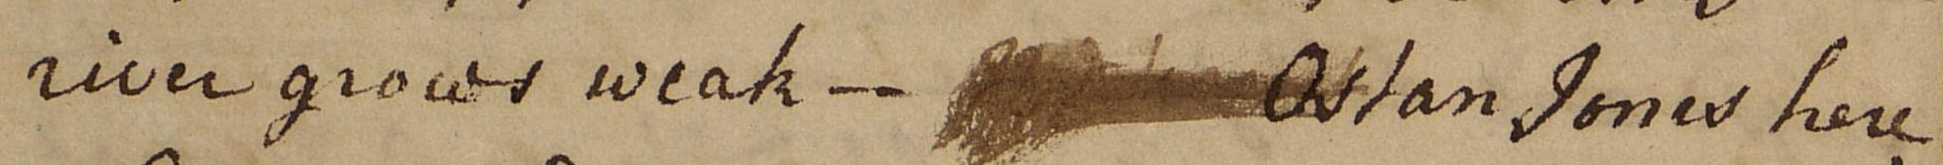river grows weak- Ostan J ones here,
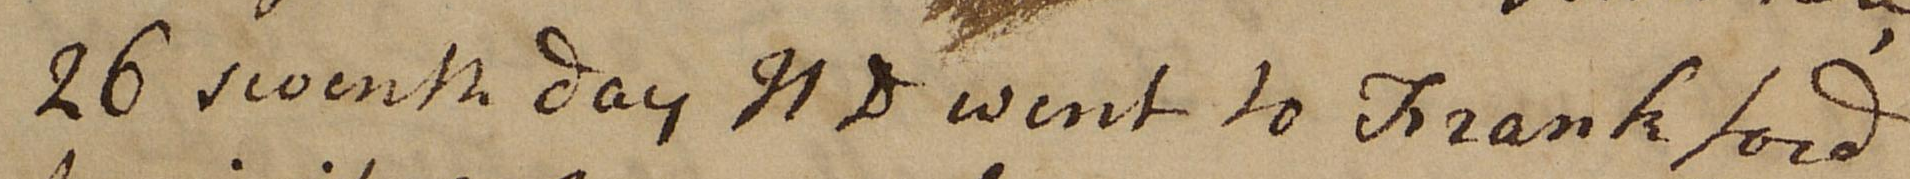26 seventh day ND went to Frankford
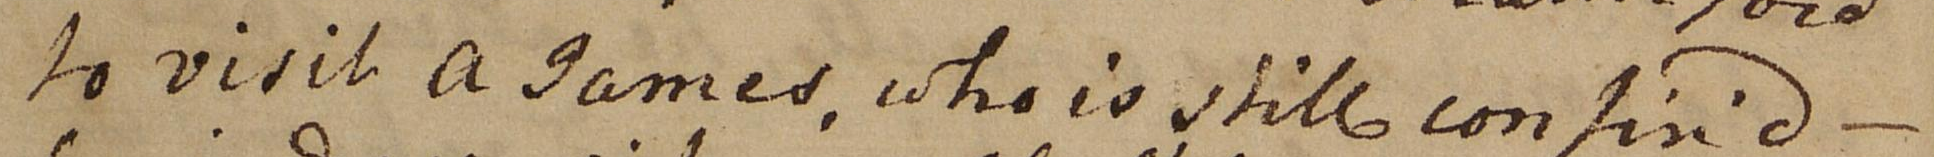to visit A James, who is still confin'd-
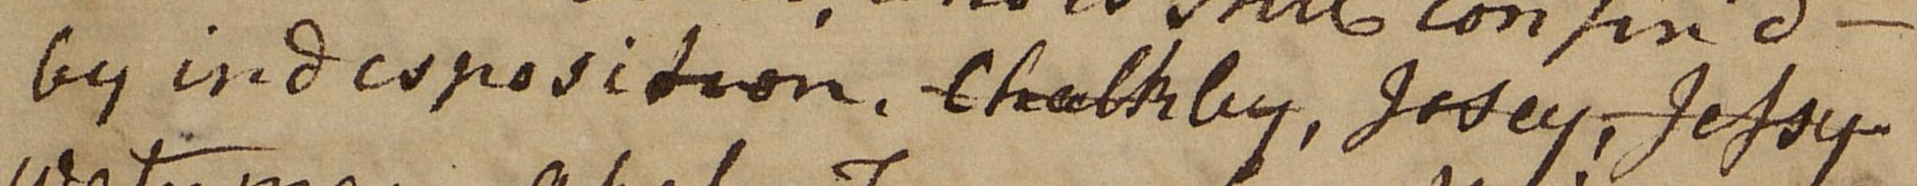by indesposition. Chalkley, Jesey, Jessy
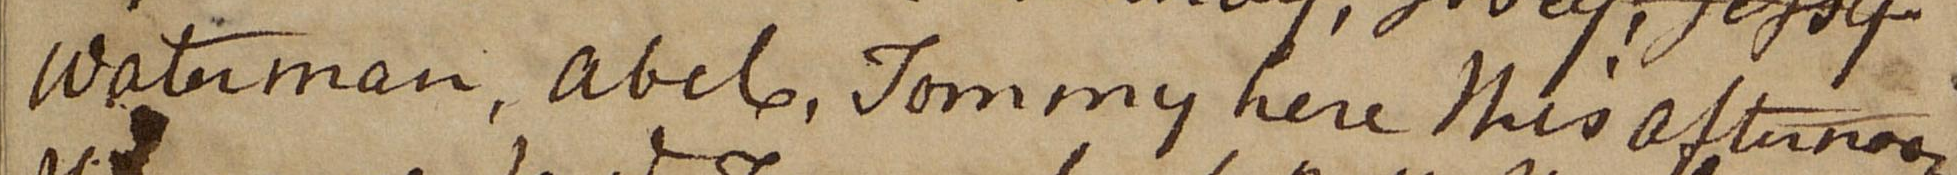Waterman, Abel, Tommy here this Afternoon
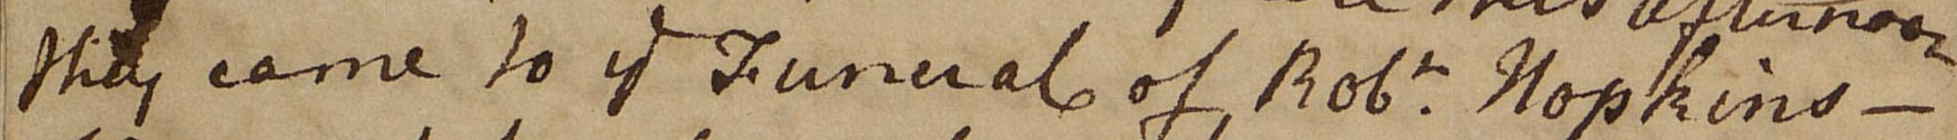they came to y^e Funeral of Rob^t. Hopkins-
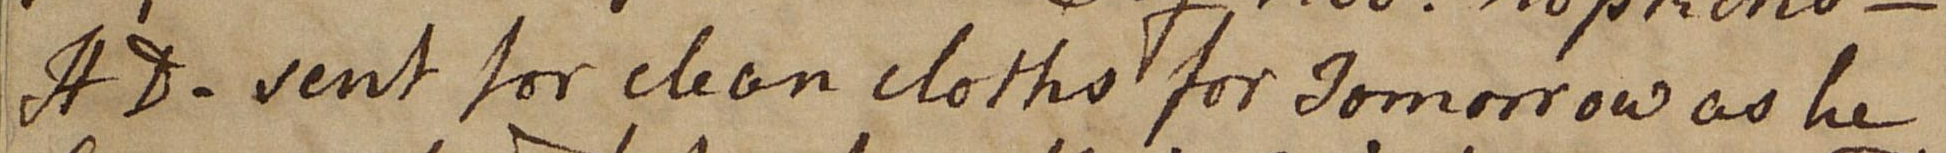HD- sent for clean cloths for Tomorrow as he
